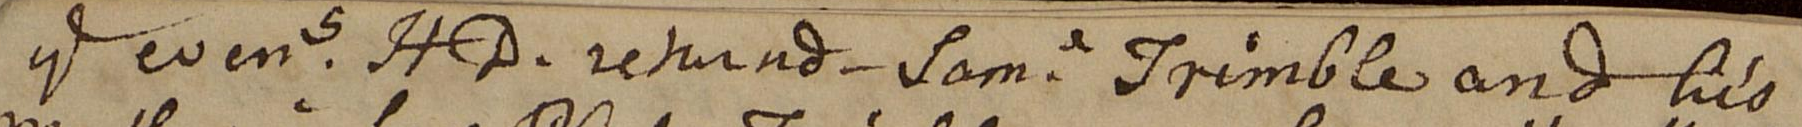y^e even^g. HD. returnd- Sam^l. Trimble and his
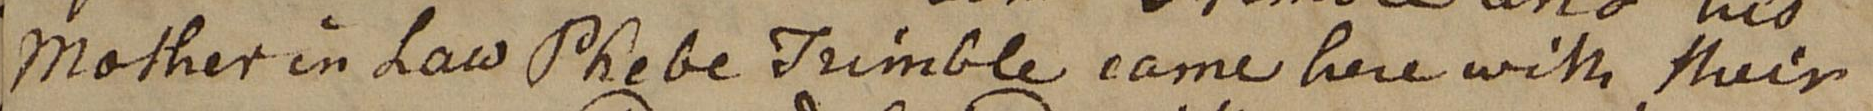Mother in Law Phebe Trimble came here with their
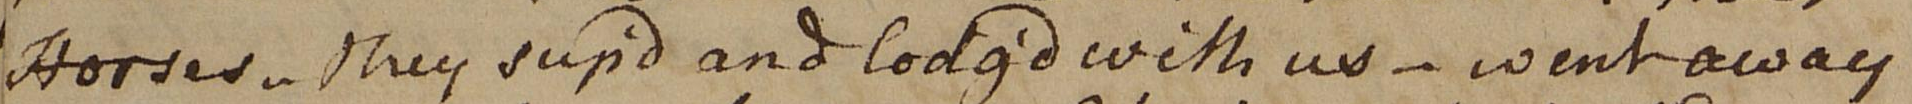Horses- They sup'd and lodg'd with us- went away
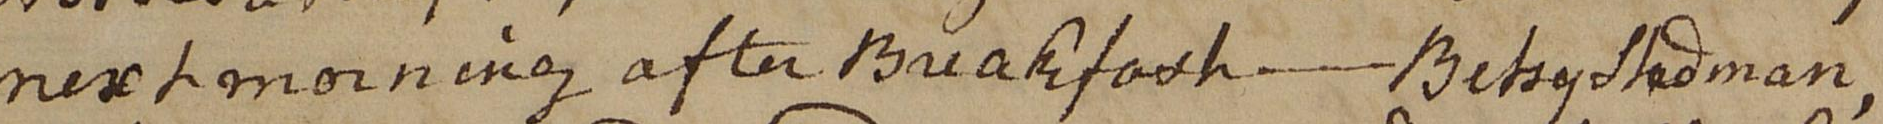next morning after Breakfast- Betsy Stedman,
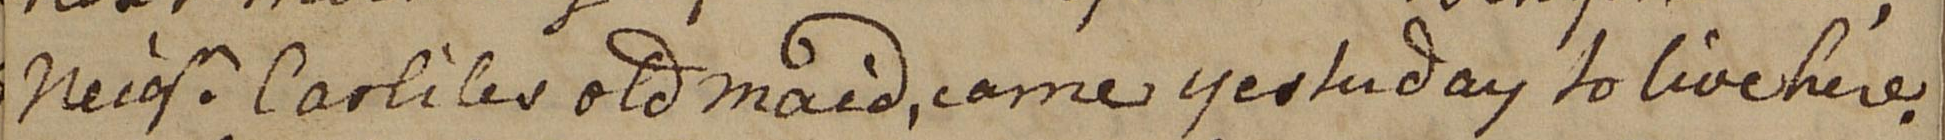Neig^r. Carliles old maid, came yesterday to live here,
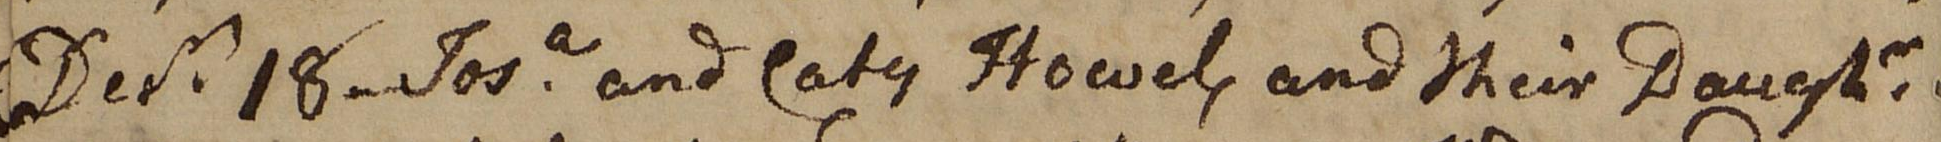Dec^r. 18- Jos^a. and Caty Howel and their Daugh^r.
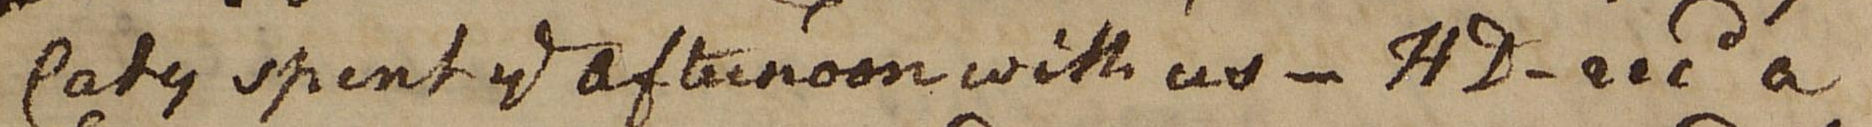Caty spent y^e afternoon with us- HD- rec^d a
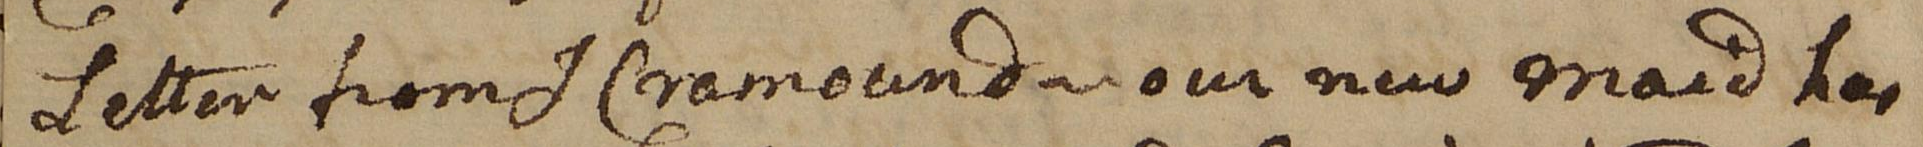Letter from I Cramound- our new maid has
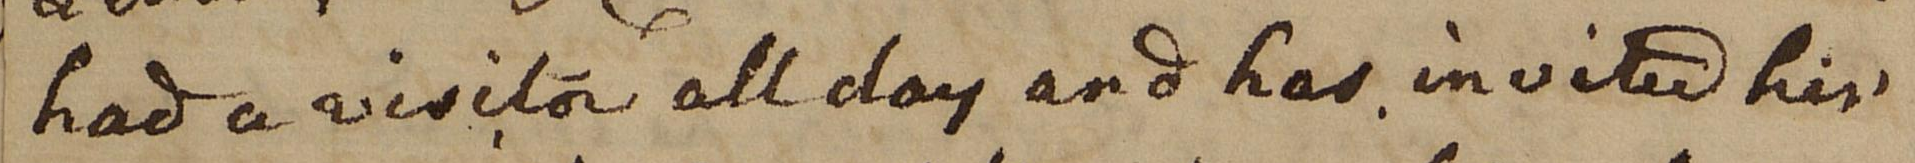had a visitor all day and has invited his
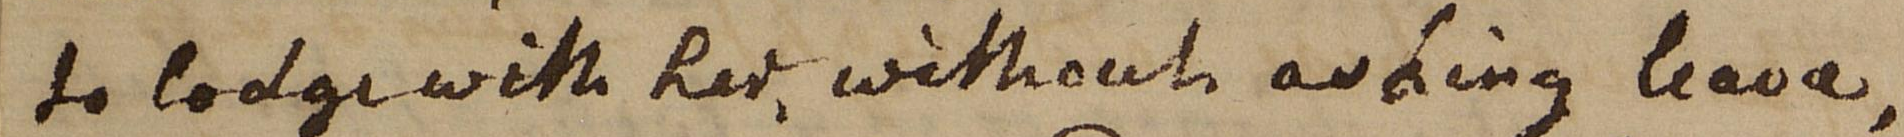to lodge with her without asking leave,
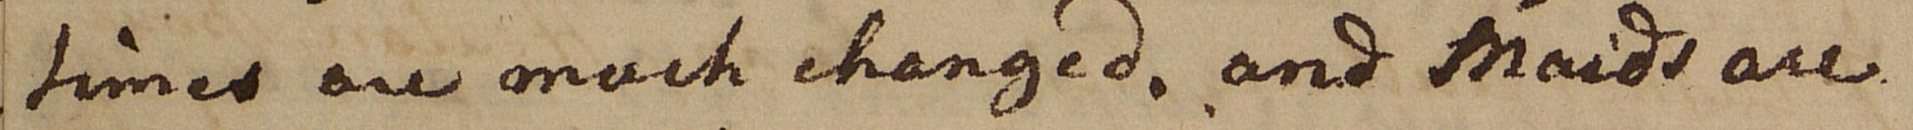times are much changed, and Maids are
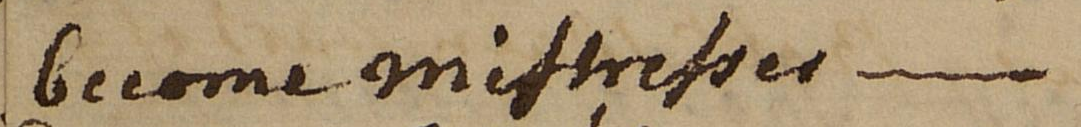become mistresses-
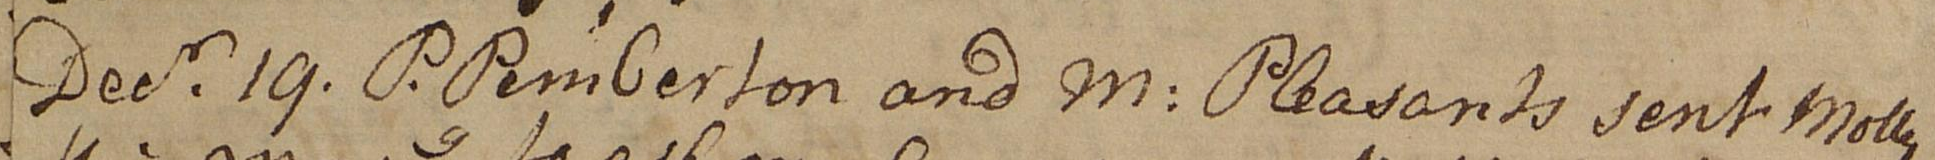Dec^r. 19. P. Pemberton and M: Pleasants sent Molly
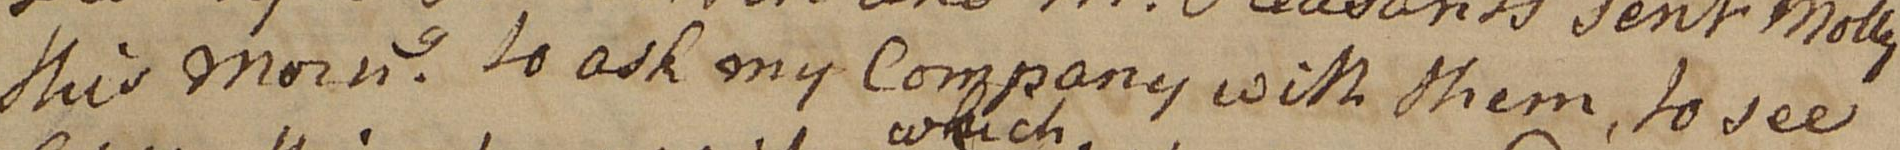this morn^g. to ask my Company with them, to see
